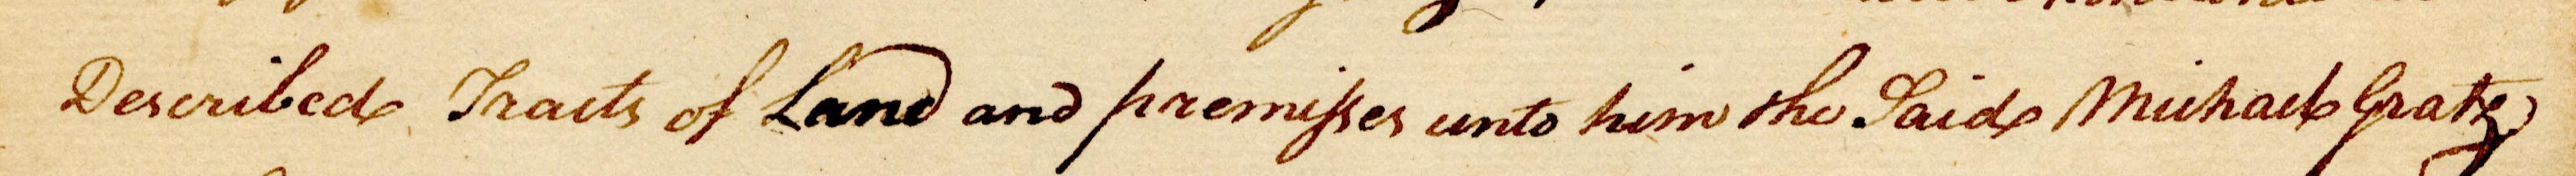Described Tracts of Land and premises unto him the said Michael Gratz
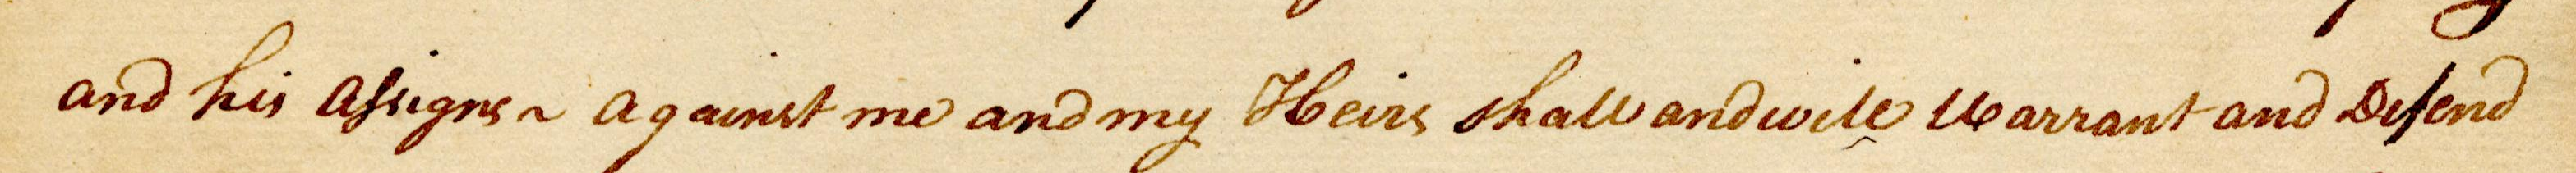and his assigns- against me and my Heirs shall and will warrant and Defend
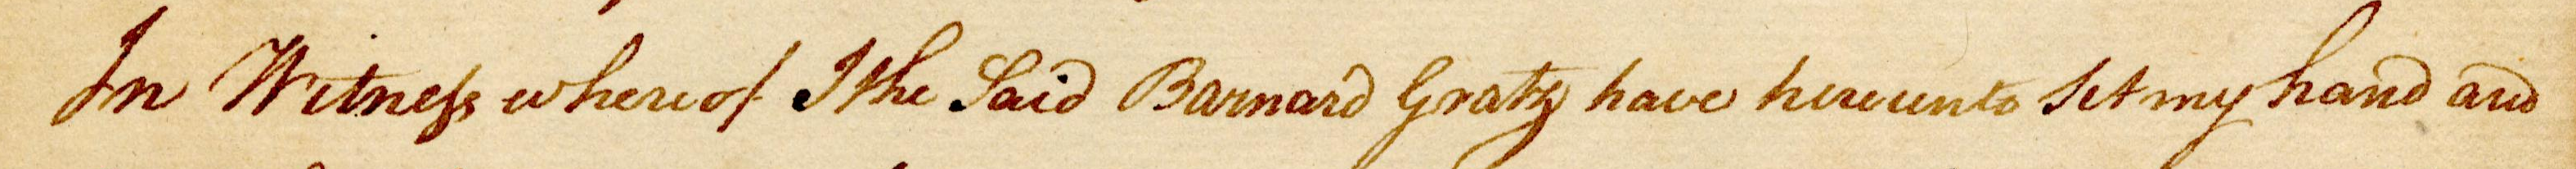In Witness whereof I the Said Barnard Gratz have hereunto Set my hand and
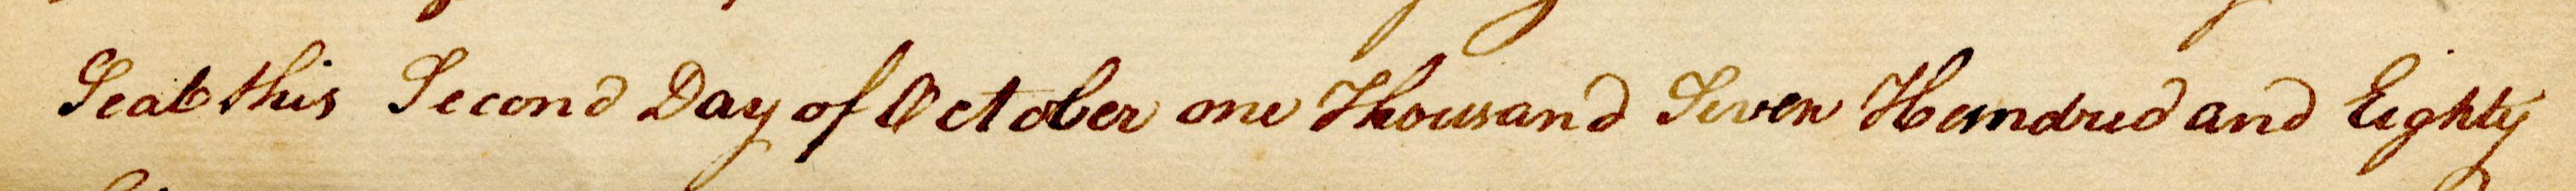Seal this Second Day of October one Thousand Seven Hundred and Eighty
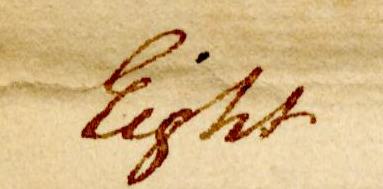Eight
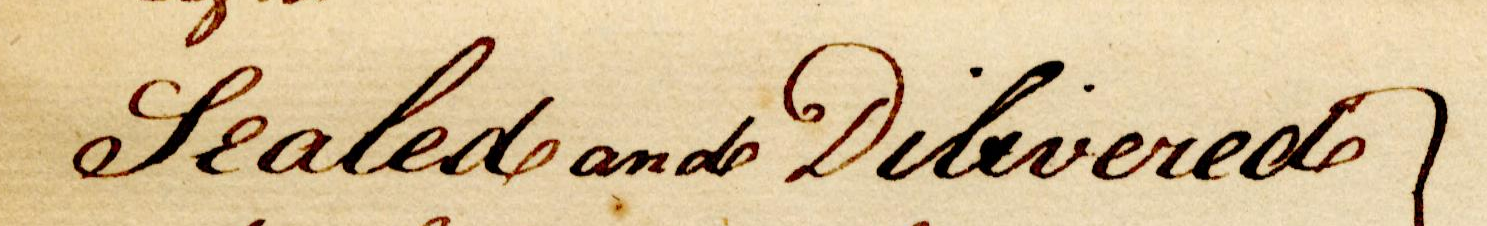Sealed and Dilivered
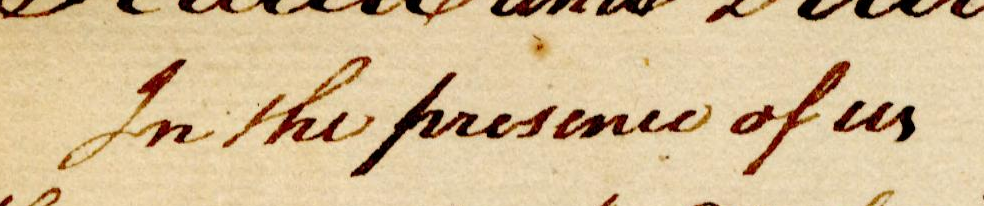In the presence of us
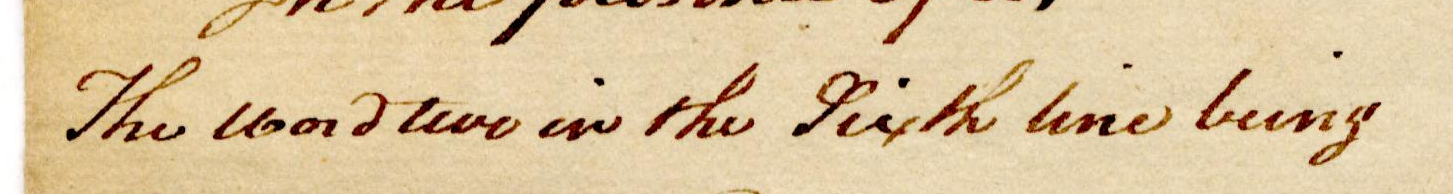The word two in the sixth line being
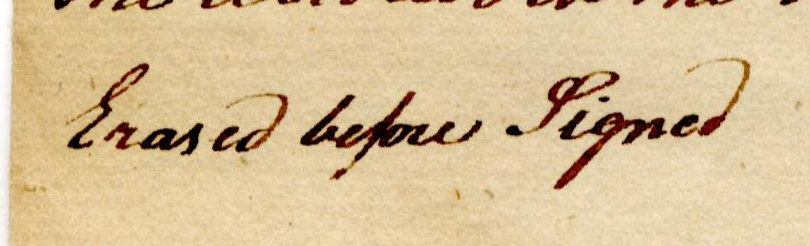Erased before Signed
